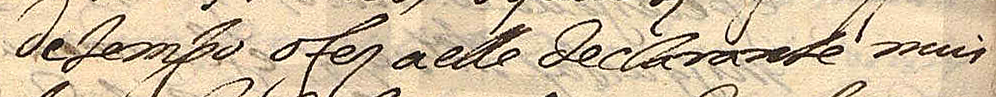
de tempo o fez a elle declarante mui
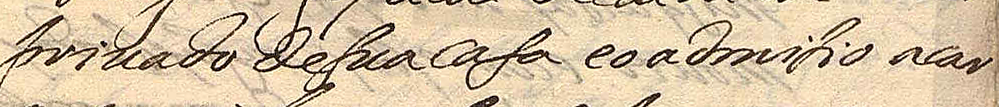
priuado de sua casa e o admitio a car
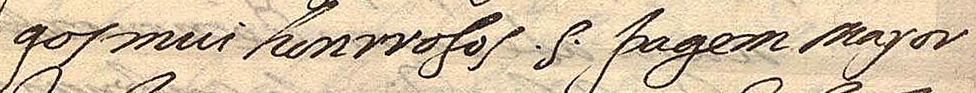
gos mui honrrosos .s. pagem Mayor
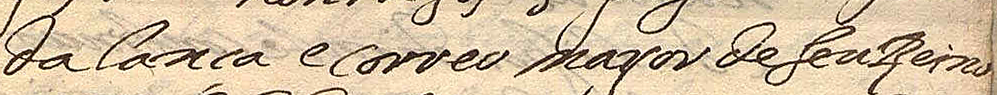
da lança e correo mayor de seu Reino
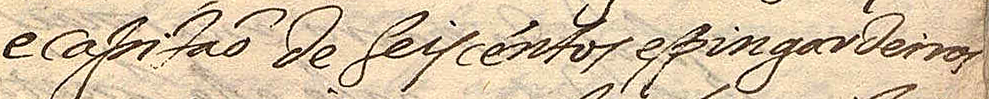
e capitaõ de seiscentos espingardeiros
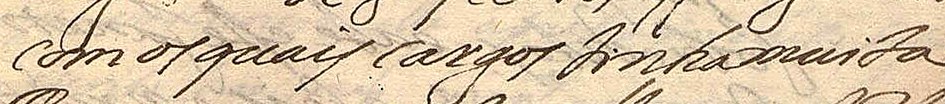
com os quais cargos tinha muita
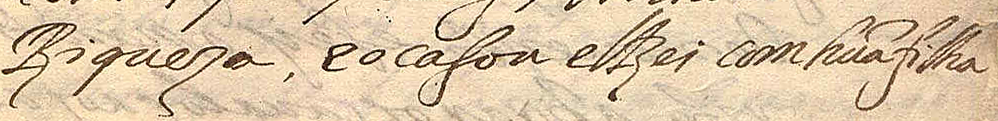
Riqueza, e o casou el Rei com huā filha
